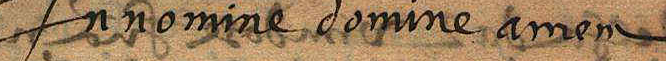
Jn nomine domine amem
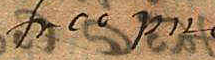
frco pires
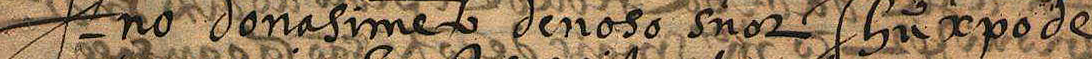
Ano do nasimēto de noso snōr Jhū xp̄o de
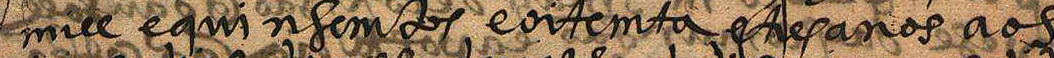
mill e quinhemtos e oitemta e tres anos aos
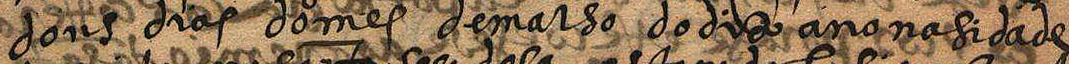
dous dias do mes de marso do dito ano na sidade
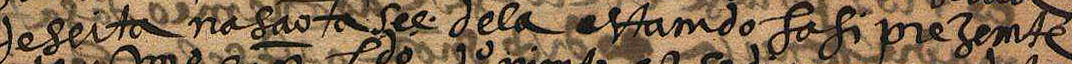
de seita na sãota see dela estamdo hahi prezemte
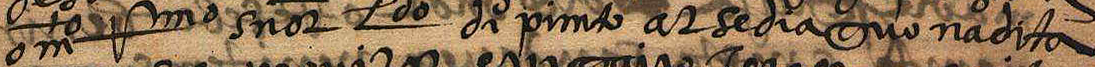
o mto Rmo snōr Ldo dio pimto arsediaguo na dita
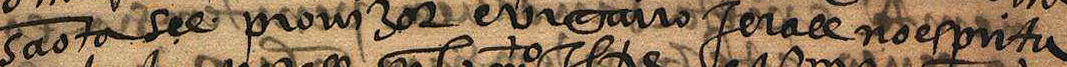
sãota see prouizor e vigairo Jerall no esꝑritu
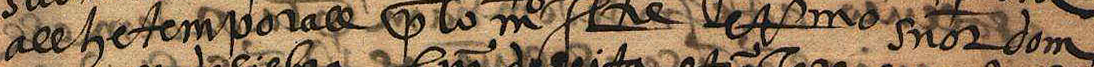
all he temporall p̄lo mto JLtre e Rmo sen̄or dom
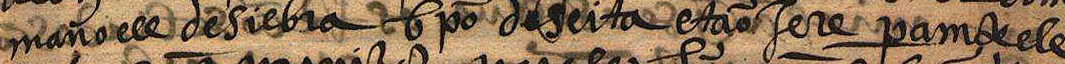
manoell de siebra bpō de seita e taõJere ꝑamte ele
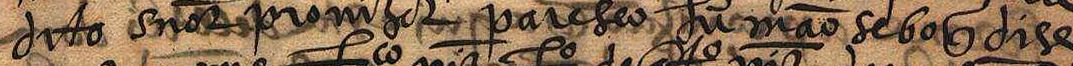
dito snōr prouizor pareseo hū mãosebo q̄ dise
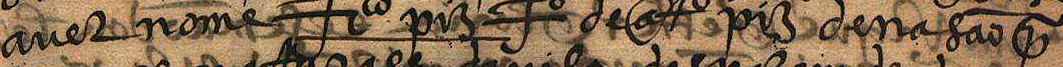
auer nome frco pīz fo de āto pīz de nasão p̄o
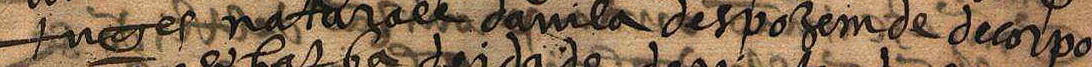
tuges naturall da uila despozemde de corpo
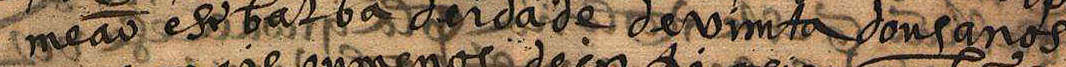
meão e sē barba de idade de vinta dous anos
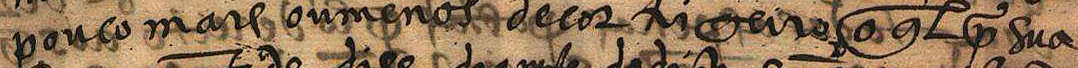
pouco mais ou menos de cor trigeiro o q̄L p̄o sua
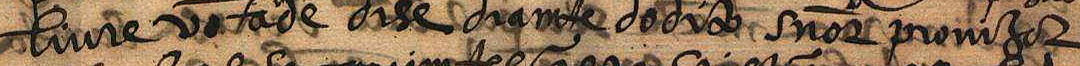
liure vōtade dise diamte do dito snōr prouizor
